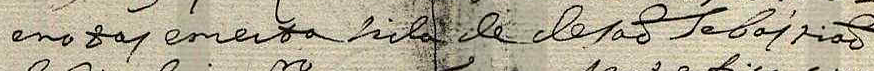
e notas em esta cidade de saõ Sebastiaõ
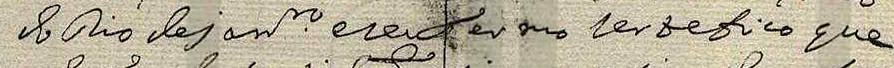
do Rio de janr.o e seu Termo certifico que
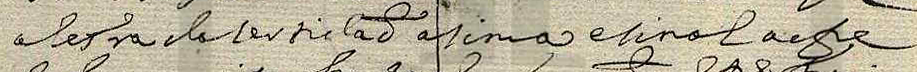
a letra na certidaõ asima e sinal ao pe
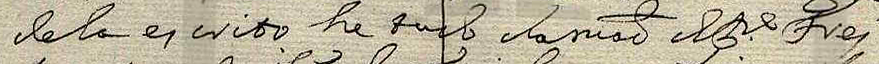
dela escrito he tudo da maõ d P.e Frej
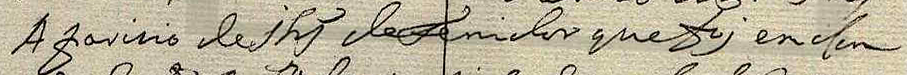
Aparicio de Ihs̄ deFenidor que foj em o Con
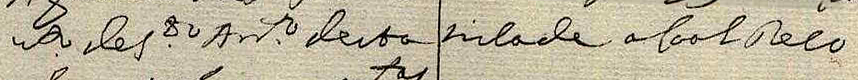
ut.o de s.to An.to desta cidade a Coal Reco
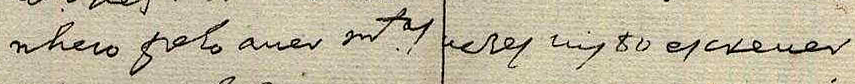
nheço pelo auer m.tas vezes uisto escreuer
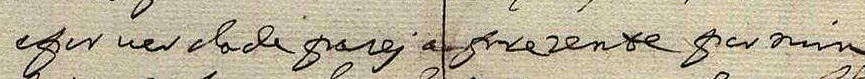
e por uerdade pasej a prezente por min
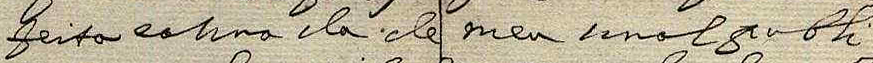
feita e asinada de meu sinal publi
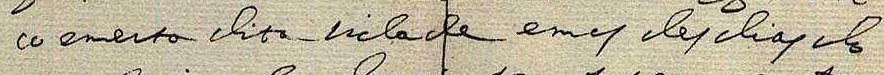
co em esta dita cidade em os des dias do
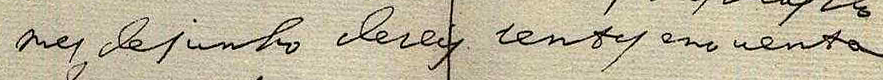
mes de junho de seiscentos e nouenta
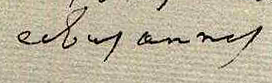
e dous annos
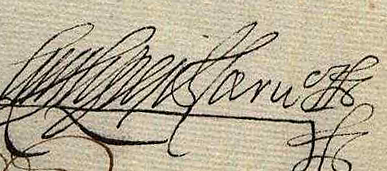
luis lopes d̄ Caruo
